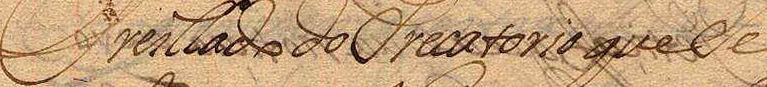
Tresllado do Precatorio que se
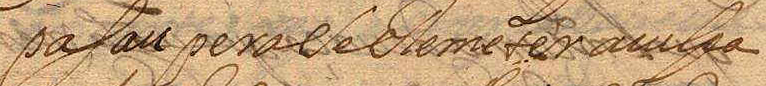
passou pera Se Remeter a culpa
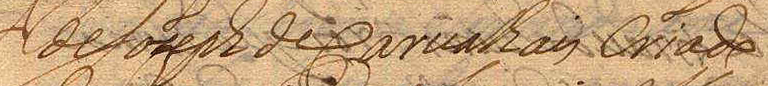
de Jozeph de Carualhais Criado
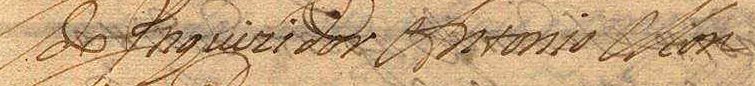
do Jnquizidor Antonio Mon
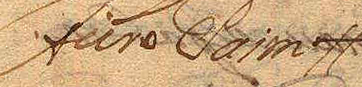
teiro Paim //
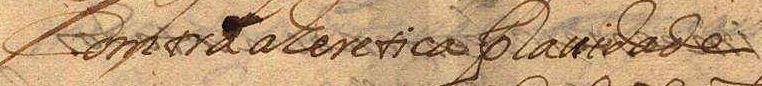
Comtra a heretica prauidade
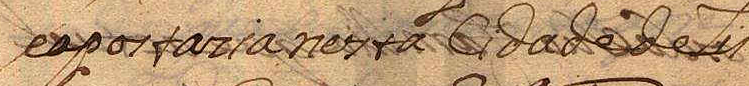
e apostazia nesta Cidade de Lis
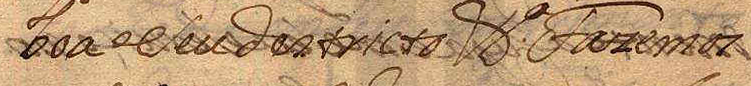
boa e seu destricto &.a Fazemos
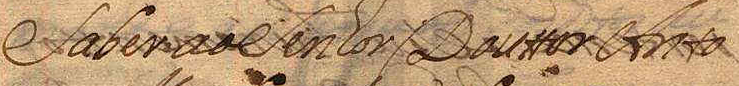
Saber ao Senhor Douttor Anto
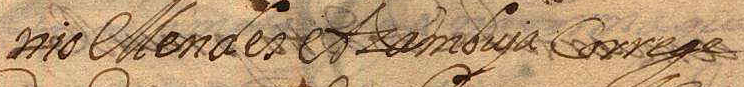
nio Mendes Azambuja Correge
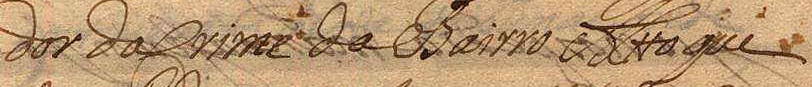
dor do Crime do Bairro Altto que
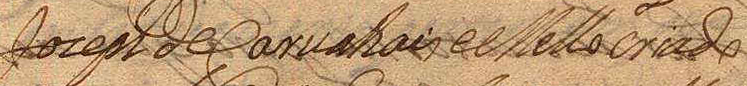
Jozeph de Carualhais e Mello criado
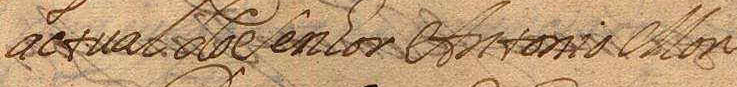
actual do Senhor Antonio Mon
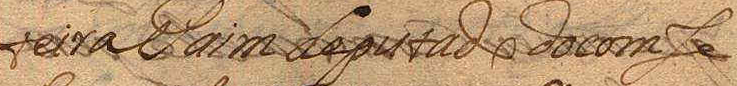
teiro Paim deputado do comse
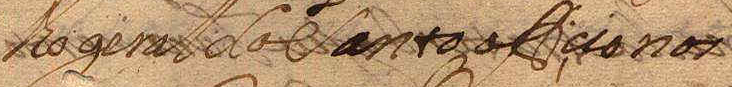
lho geral do Santo officio nos
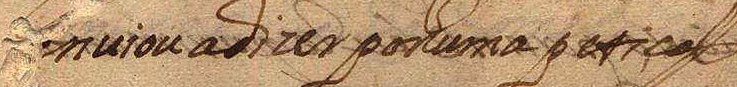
enuiou a dizer por huma petiçaõ
